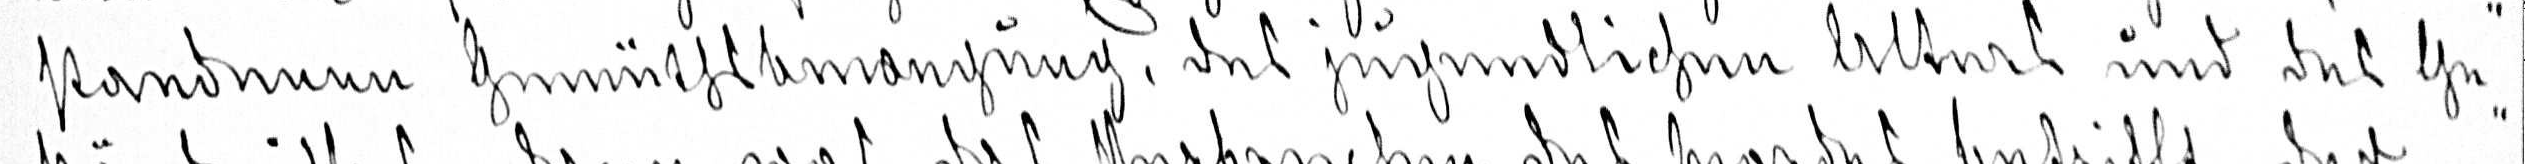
standenen Gemüthsbewegung, des jugendlichen Alters und des Ge¬
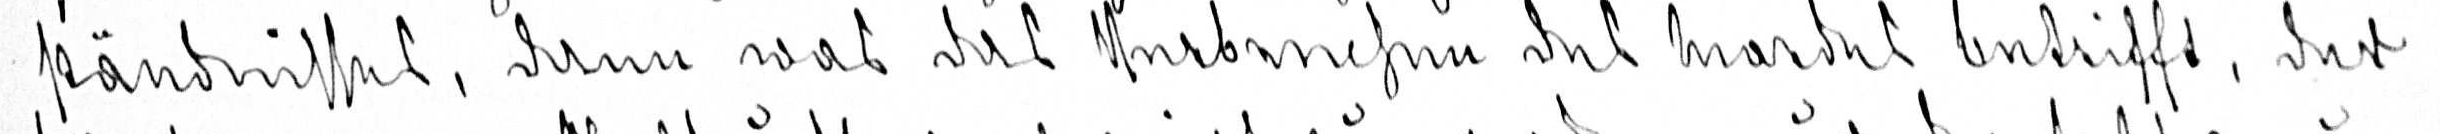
ständnisses, dann was das Verbrechen des Mordes betrifft, der
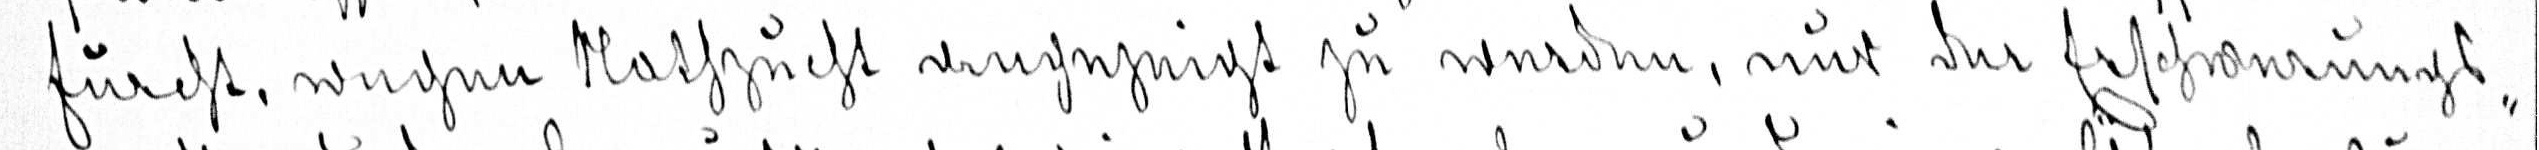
Furcht, wegen Nothzucht angezeigt zu werden, nur der Erschwerungs¬
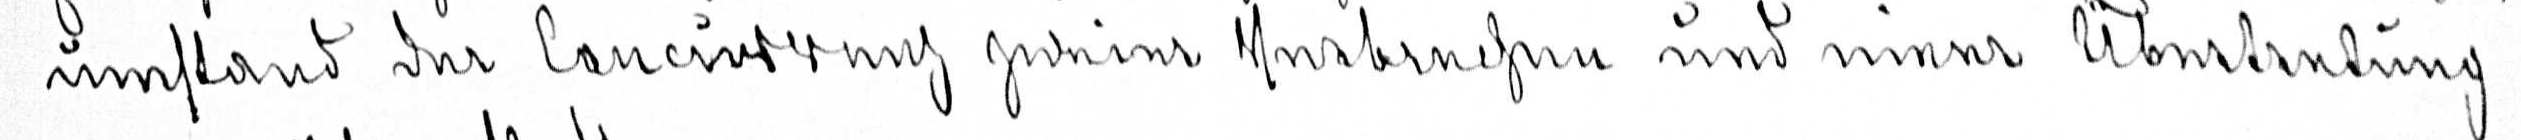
umstand der Concurrenz zweier Verbrechen und einer Übertretung
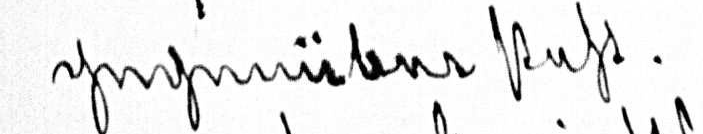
gegenüber steht.
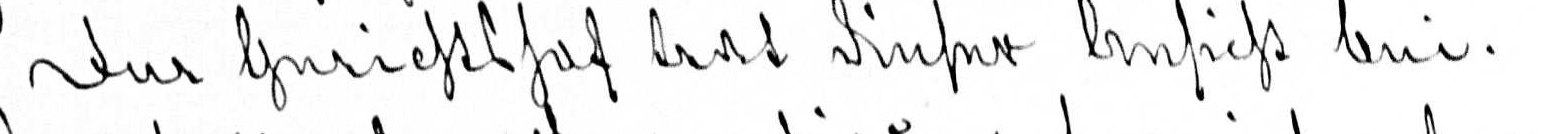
Der Gerichtshof trat dieser Ansicht bei.
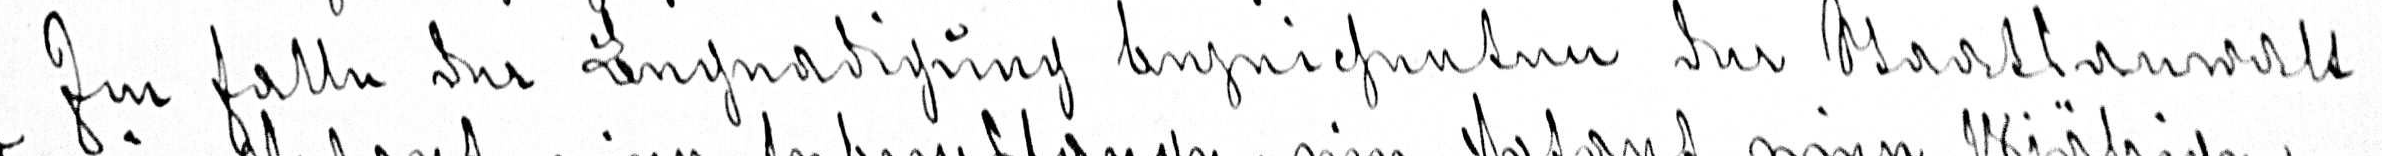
Im falle der Begnadigung bezeichneten der Staatsanwalt
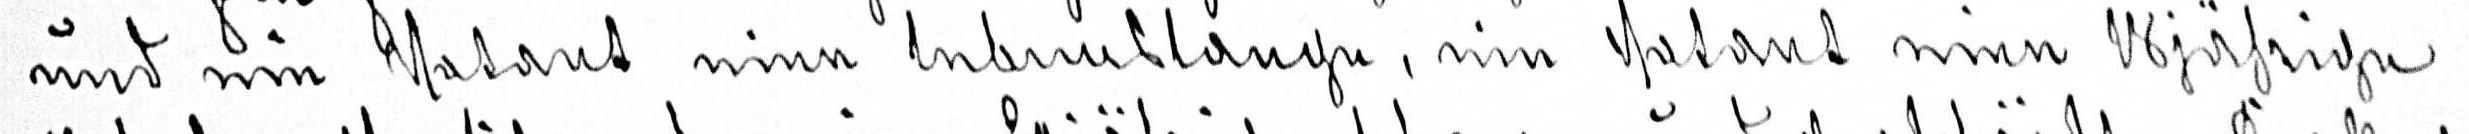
und ein Votant eine lebenslange, ein Votant eine 18jährige
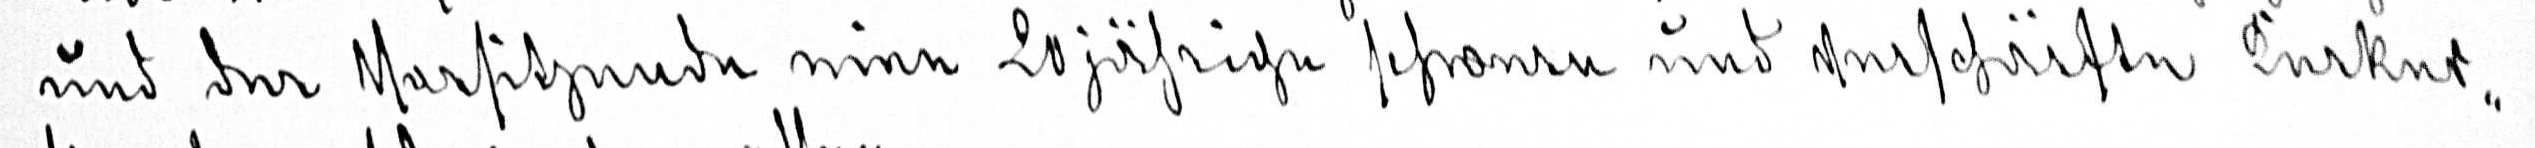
und der Vorsitzende eine 20jährige schwere und verschärfte Kerker¬
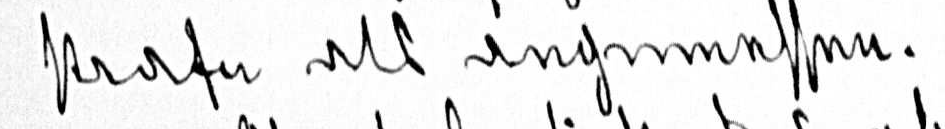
strafe als angemessen.
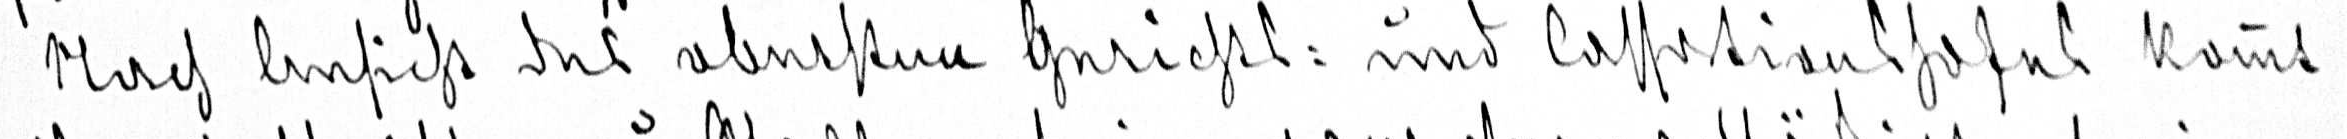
Nach Ansicht des obersten Gerichts- und Cassationshofes kommt
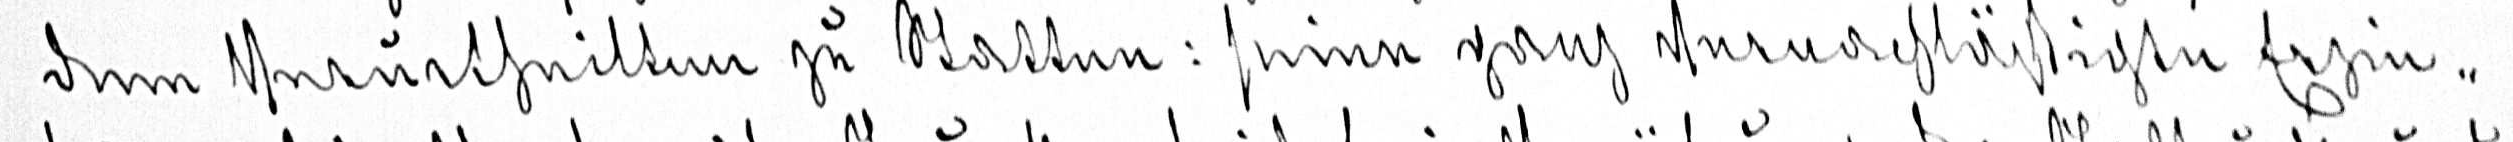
dem Verurtheilten zu Statten: seine ganz vernachläßigte Erzie¬
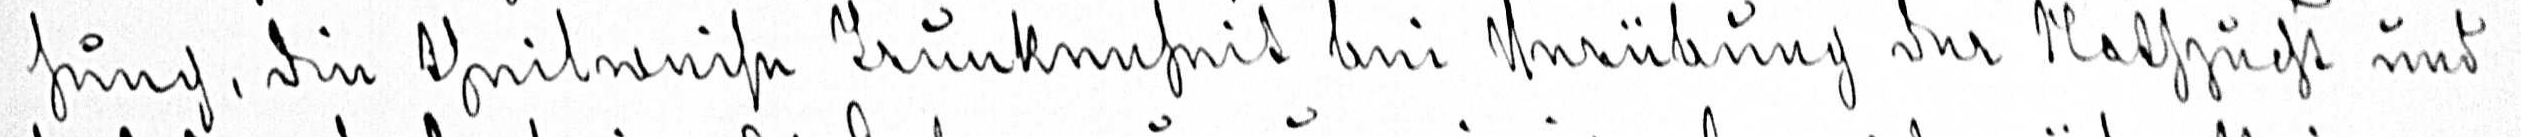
hung, die theilweise Trunkenheit bei Verübung der Nothzucht und
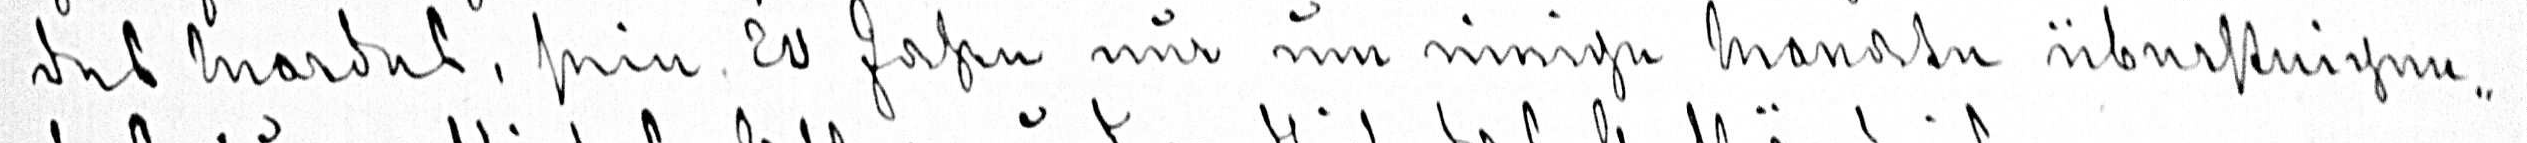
des Mordes, sein 20 Jahre ur um einige Monate übersteigen¬
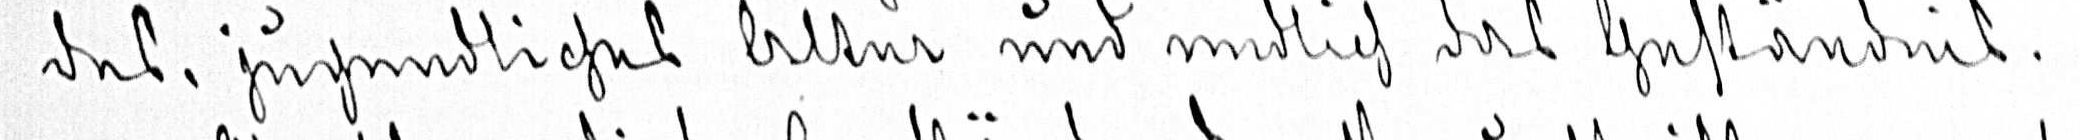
des, jugendliches Alter und endlich das Geständnis.
